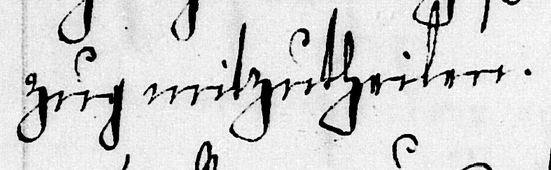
zug mitzutheilen.
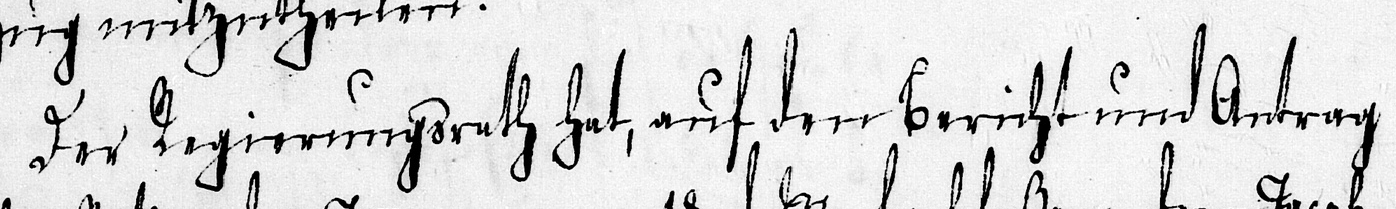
Der Regierungsrath hat, auf den Bericht und Antrag
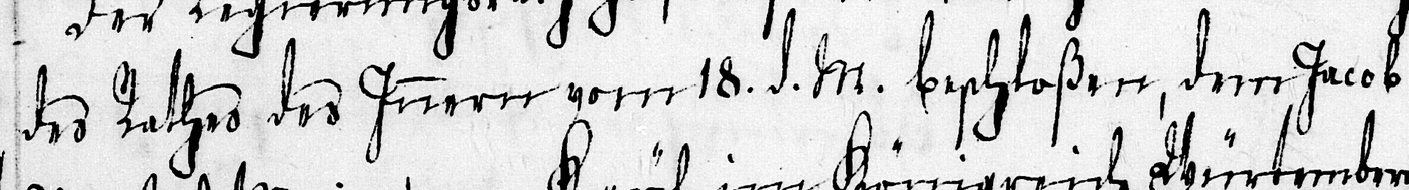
des Rathes des Innern vom 18. d. M. beschloßen, dem Jacob
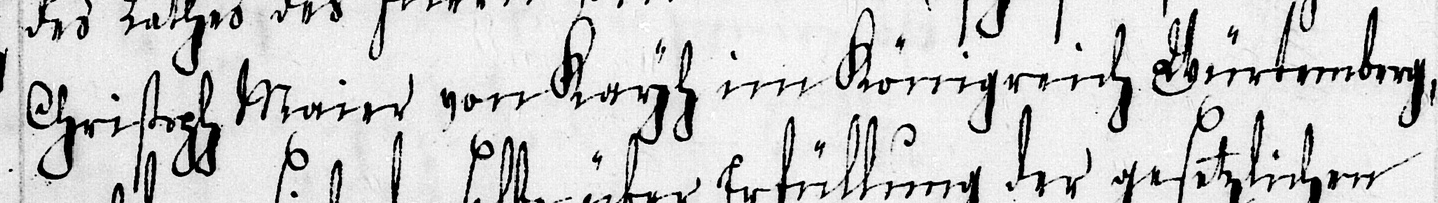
Christoph Maier von Kayh im Königreich Würtemberg,
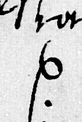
4.
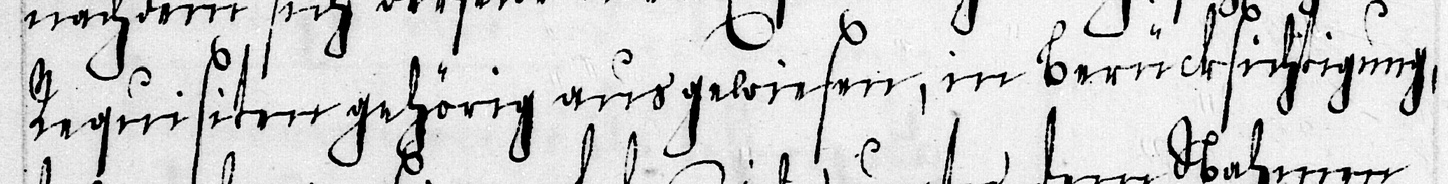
Requisiten gehörig ausgewiesen, in Berücksichtigung,
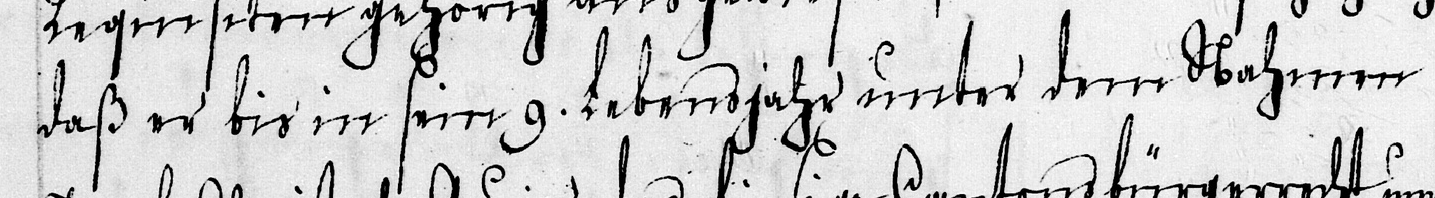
daß er bis in sein 9. Lebensjahr unter dem Nahmen
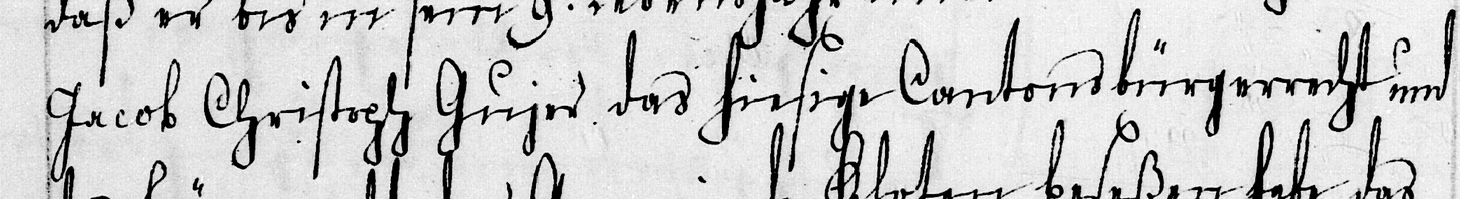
Jacob Christoph Gujer das hieisge Cantonsbürgerrecht und
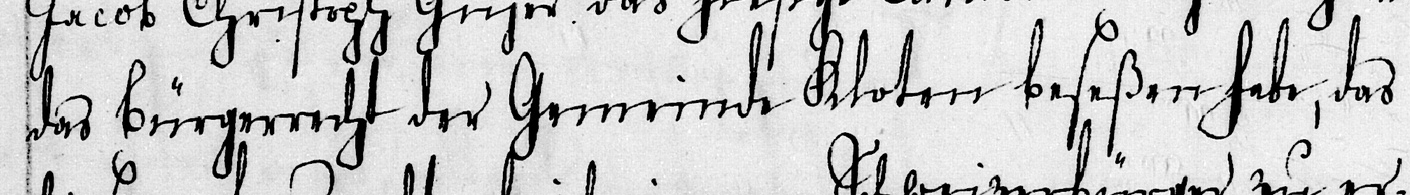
das Bürgerrecht der Gemeinde Kloten beseßen habe, das
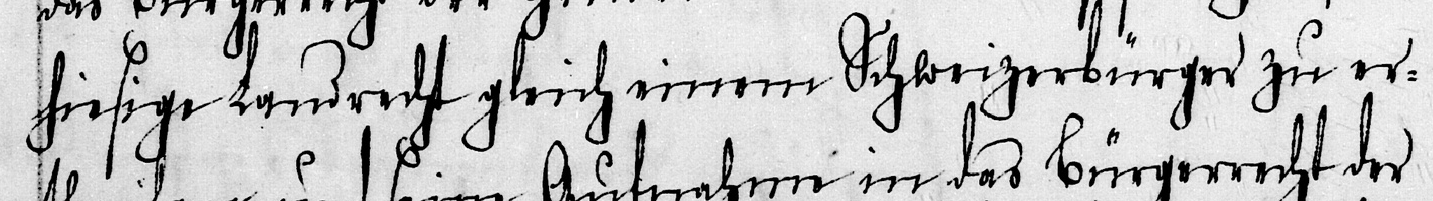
hiesige Landrecht gleich einem Schweizerbürger zu er¬
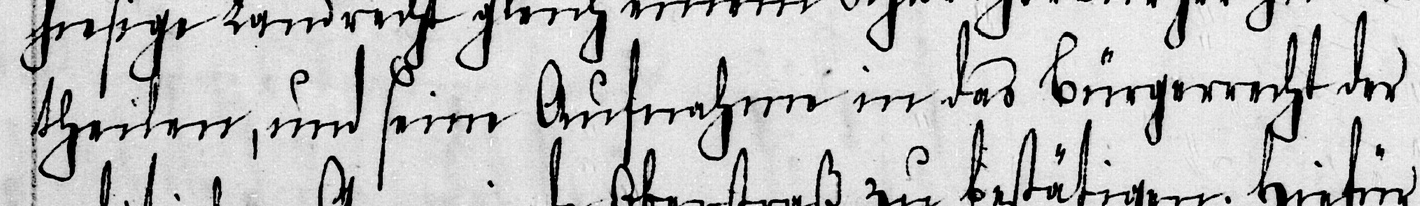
theilen, und seine Aufnahme in das Bürgerrecht der
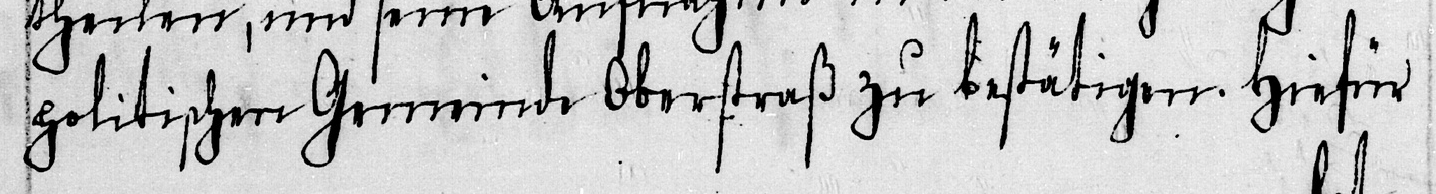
politischen Gemeinde Oberstraß zu bestätigen. Hiefür
